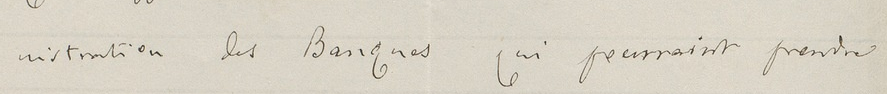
nistration des Banques qui pourraient prendre
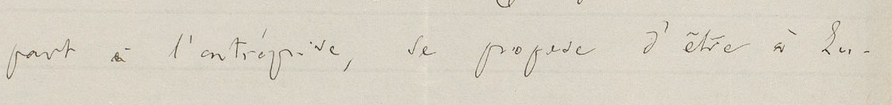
part à l'entréprise, se propose d'être à Zu-
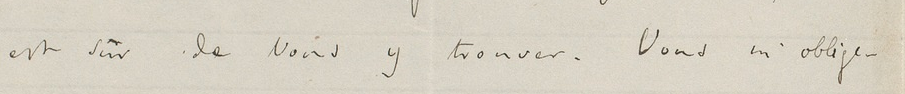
est sûr de Vous y trouver. Vous m'oblige-
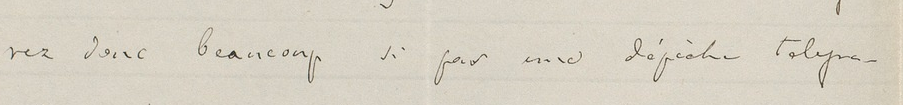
rez donc beaucoup si par une dépèche telegra-
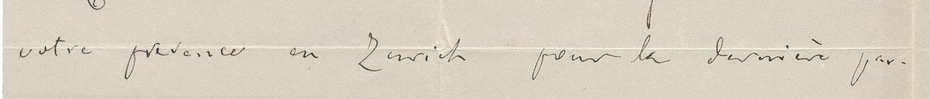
votre presence en Zurich pour la dernière par-
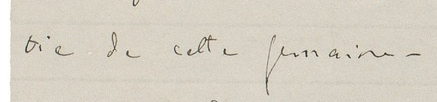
tie de cette semaine –
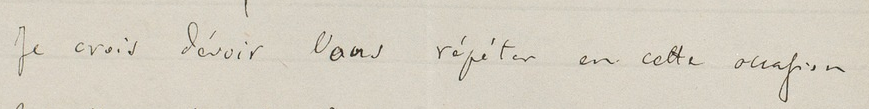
Je crois dévoir Vous répéter en cette occasion
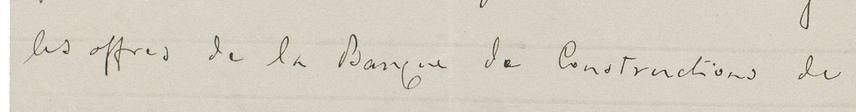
les offres de la Banque de Constructions de
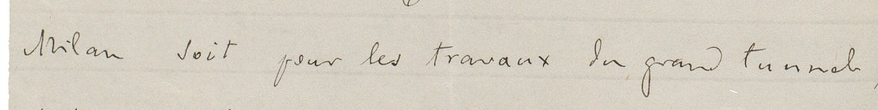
Milan soit pour les travaux du grand tunnel,
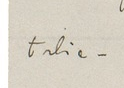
talie.
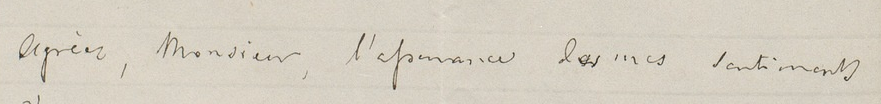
Agréez, Monsieur, l'assurance de mes sentiments
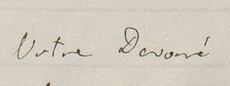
Votre Devoué
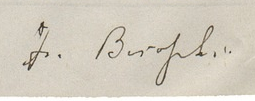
Ir. Brioschi.
